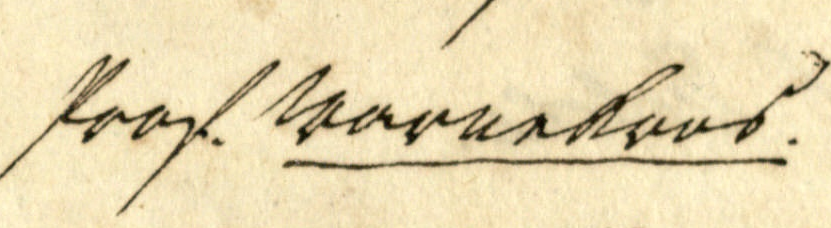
Prof. Warnekros.
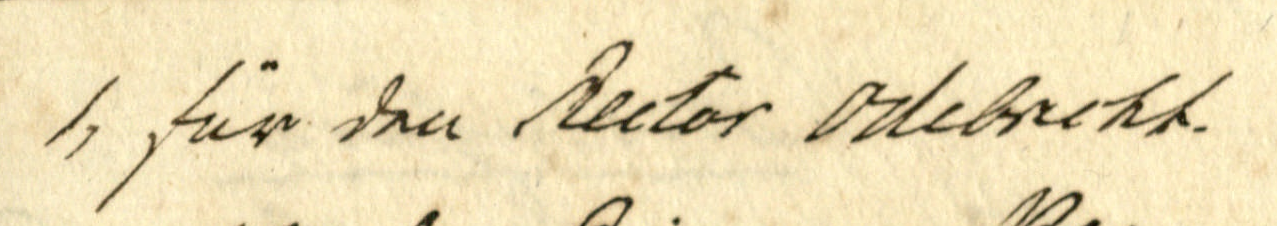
1, für den Rector Odebrecht.
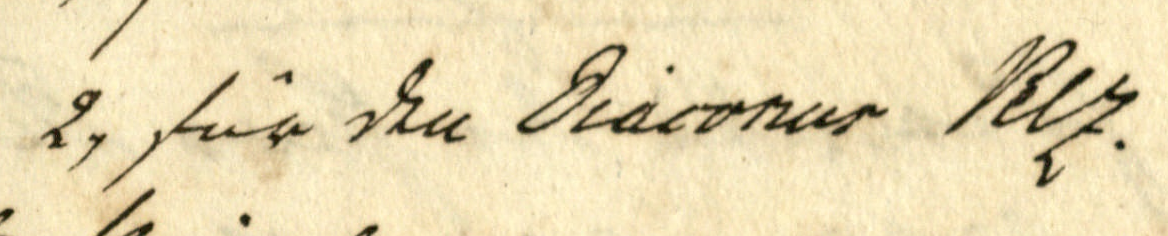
2, für den Diaconus Pelz.
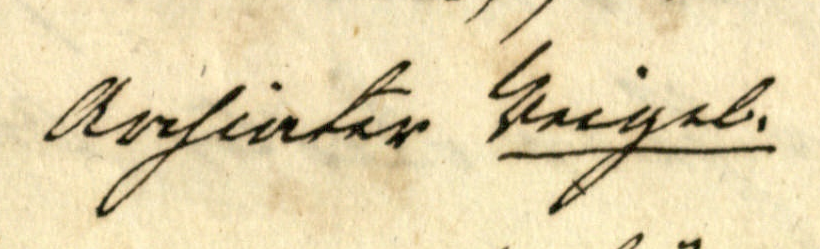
Archiater Weigel.
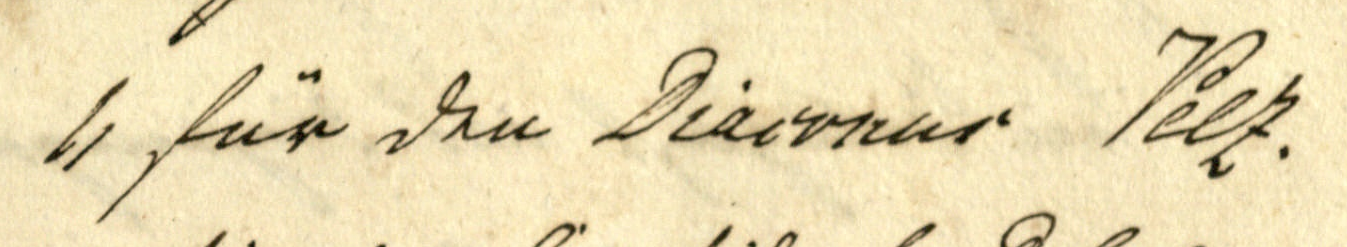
1, für den Diaconus Pelz.
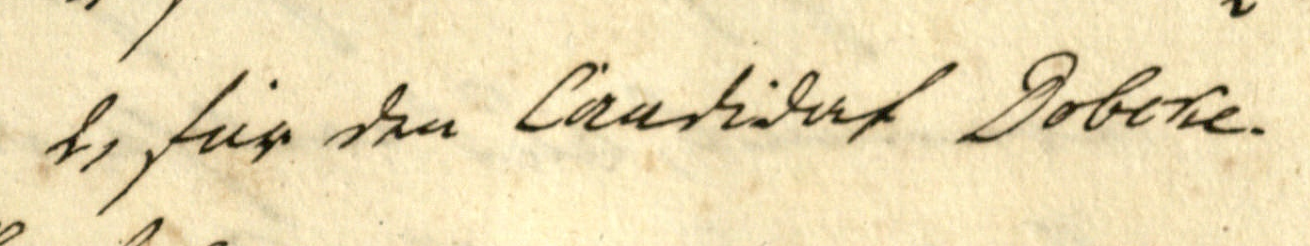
2, für den Candidat Dobcke.
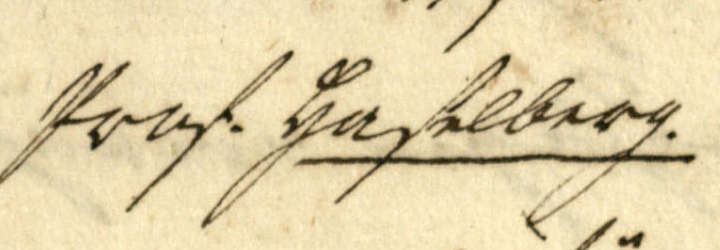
Prof. Haselberg
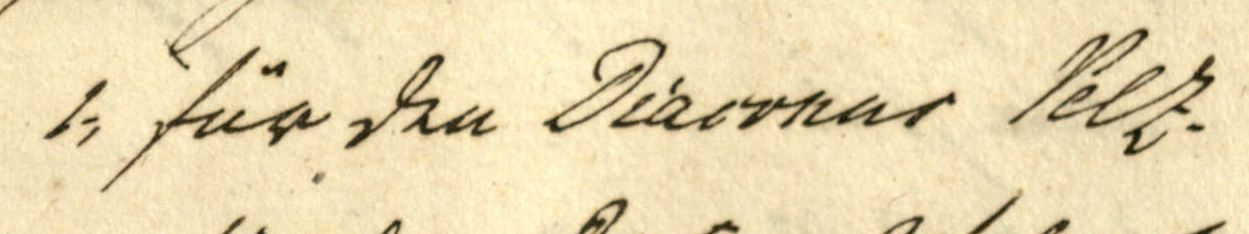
1, für den Diaconus Pelz.
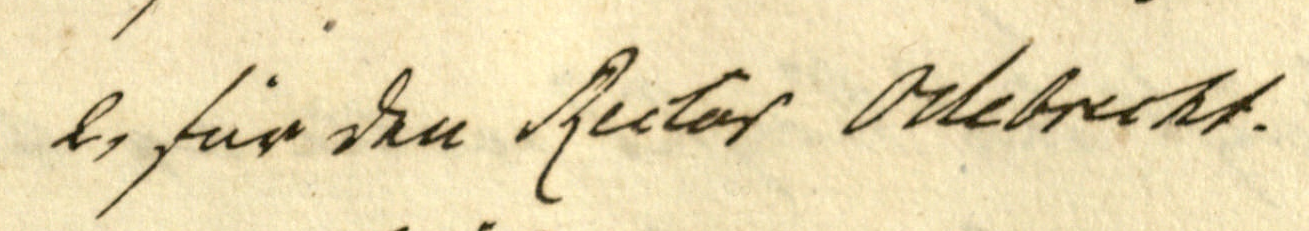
2, für den Rector Odebrecht.
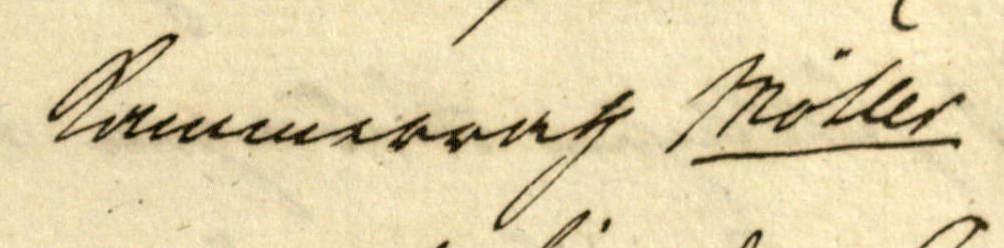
Kammerrath Möller
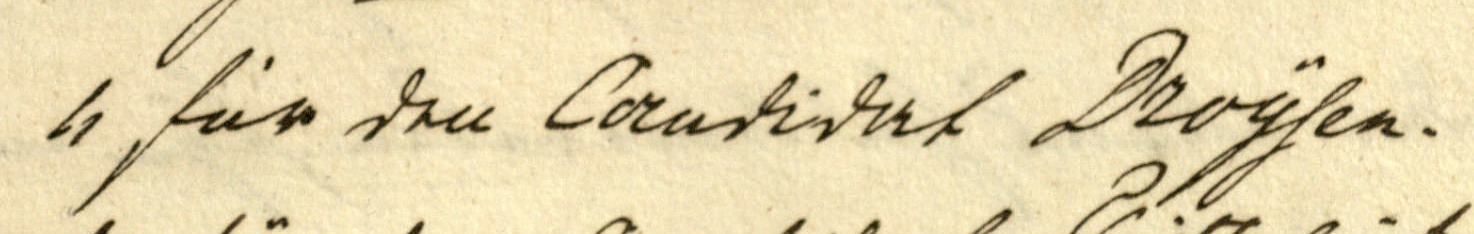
1, für den Candidat Droÿsen.
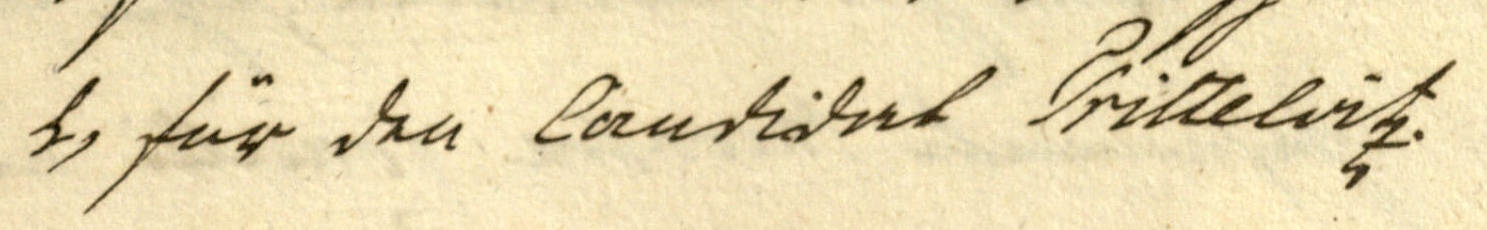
2, für den Candidat Trittelvitz
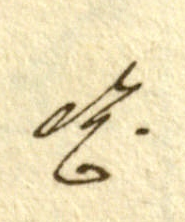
dh.
